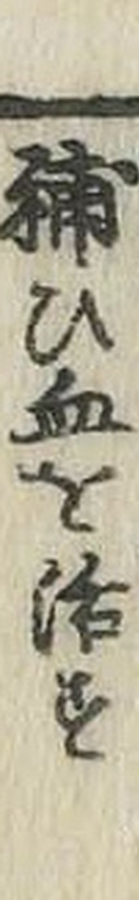補ひ血を活す
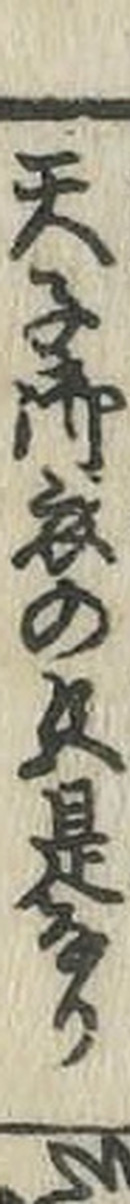天子御衣の色是なり

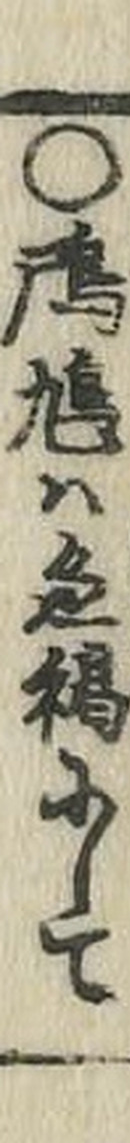○鳲鳩は色褐にして
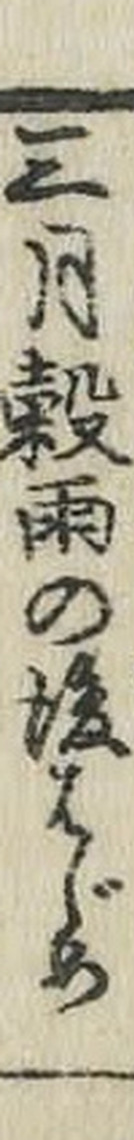三月穀雨の後はじめ
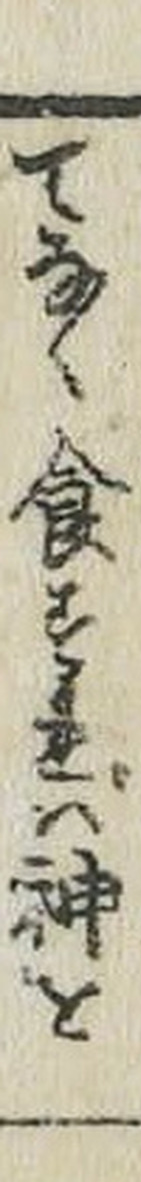てなく食すれは神を
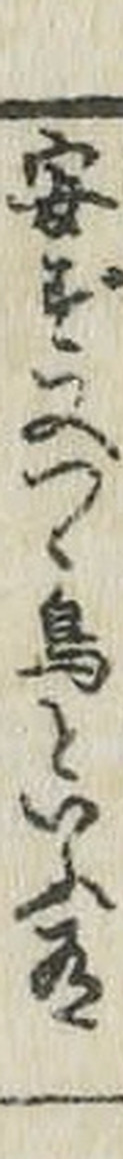安ず又つゝ鳥といふ有
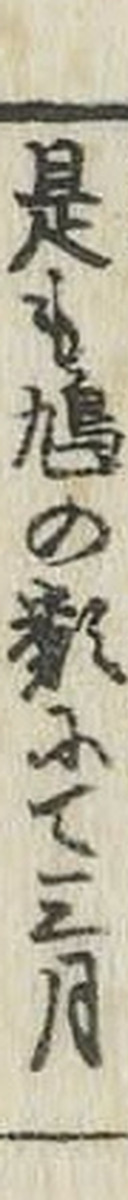是も鳩の類にて三月
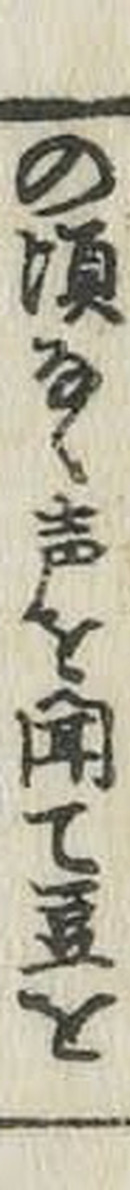の頃なく声を聞て豆を
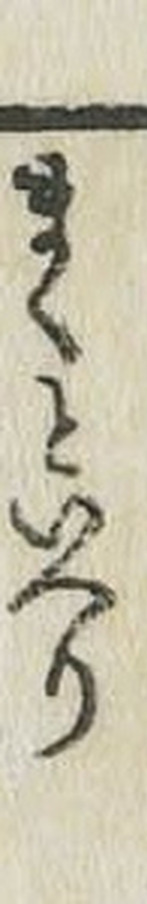まくといへり
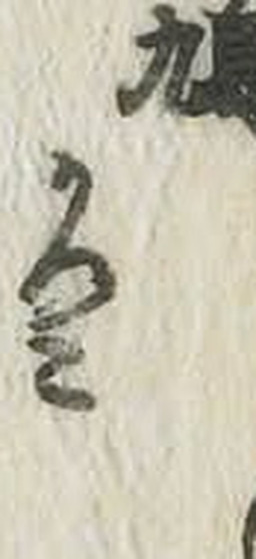かつこ
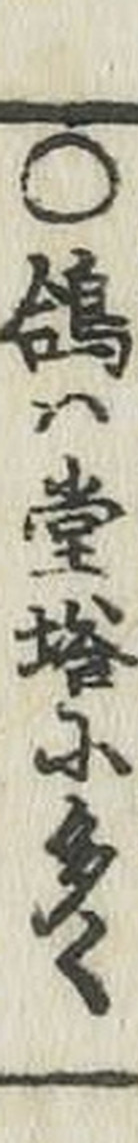○鴿は堂塔に多く
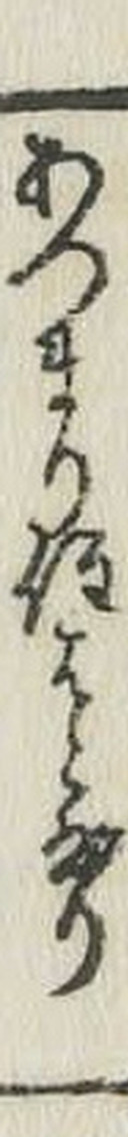あつまり住はとなり
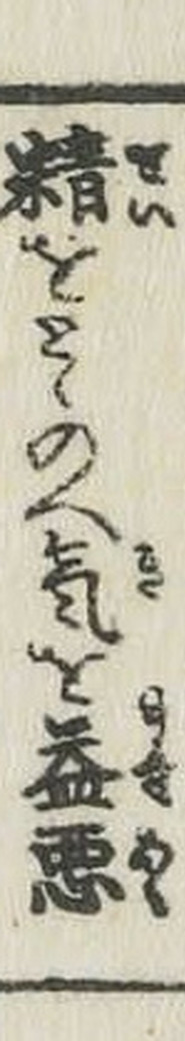精をとゝのへ気を益悪
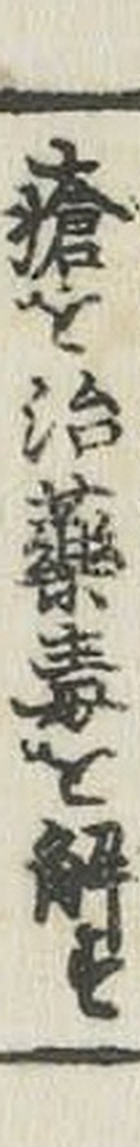瘡を治薬毒を解す
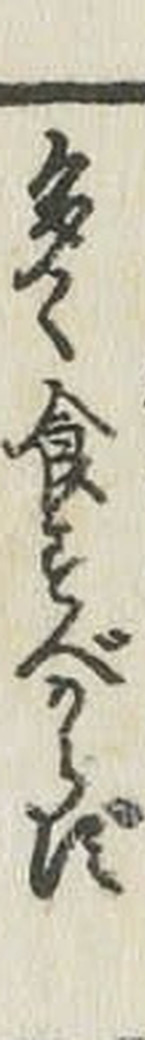多く食すべからず
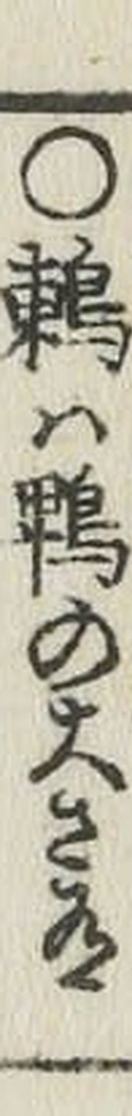○鶇は鵯の大さ有
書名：増補頭書訓蒙図彙大成 10巻 6:巻之12-13
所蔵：東京学芸大学教育コンテンツアーカイブ
